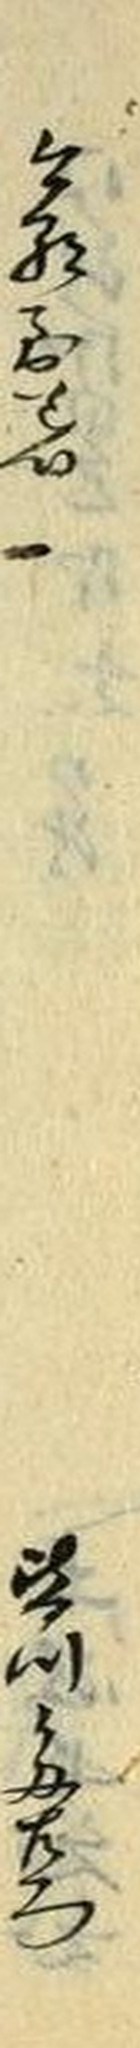今朝到着皆川多左衛門
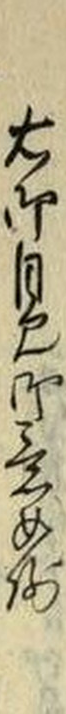右御目見御意如例
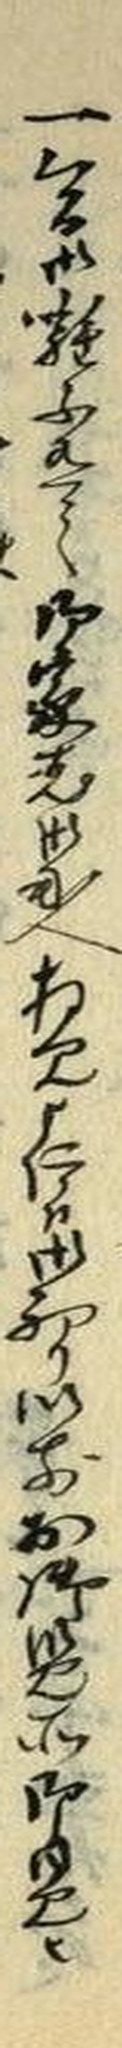一今日御囃子有之御家老御用人拝見被仰付御初り以前於御覧所御目見被
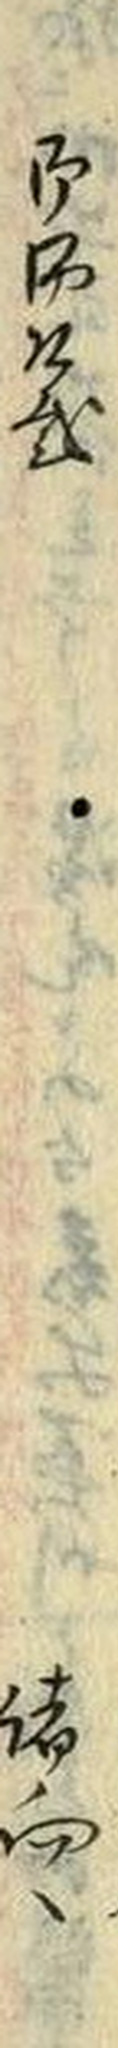御酒頂戴諸向へ
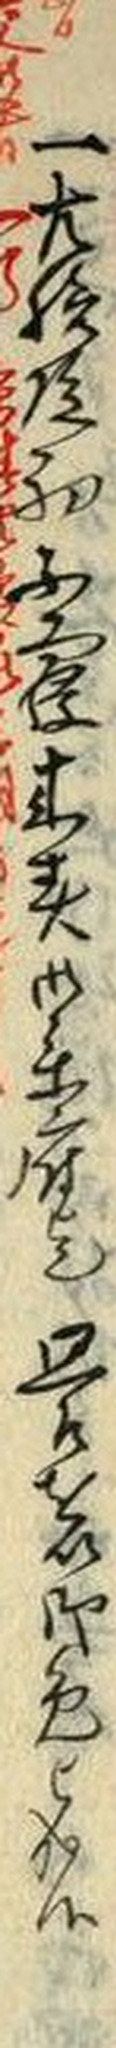一左膳殿初不寝来春御参府迄思召を以御免被成候
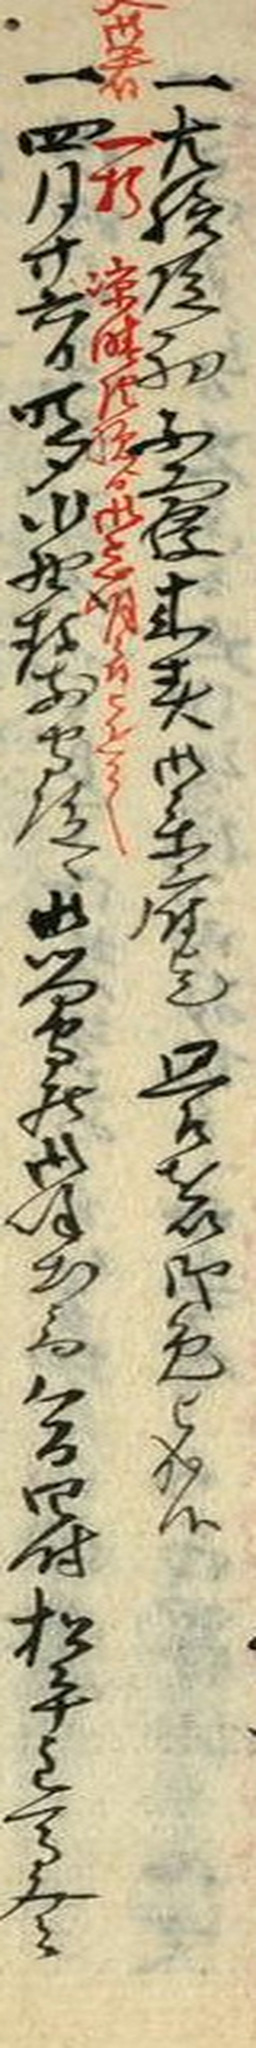一四月廿六日昨夕水野越前守殿へ御留守居御呼出ニ而今日四時松平主馬登
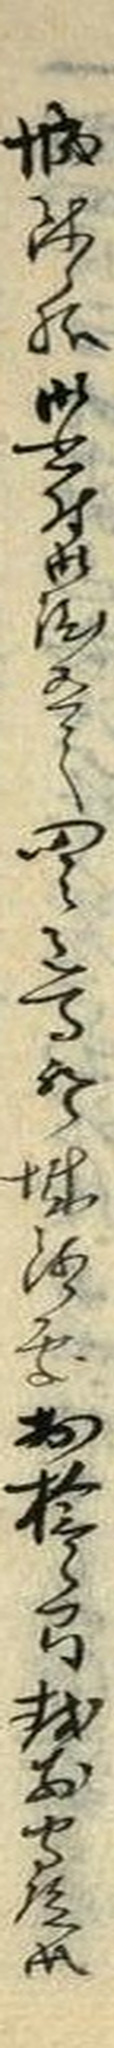城致候様御書付御渡有之同日主馬登城致候処於檜之間越前守殿御
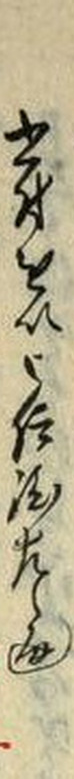書付を以被仰渡左之通
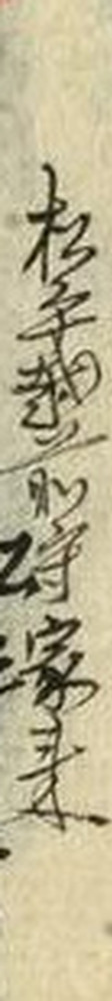松平越前守家来
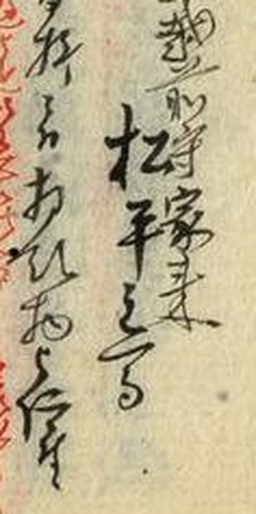松平主馬
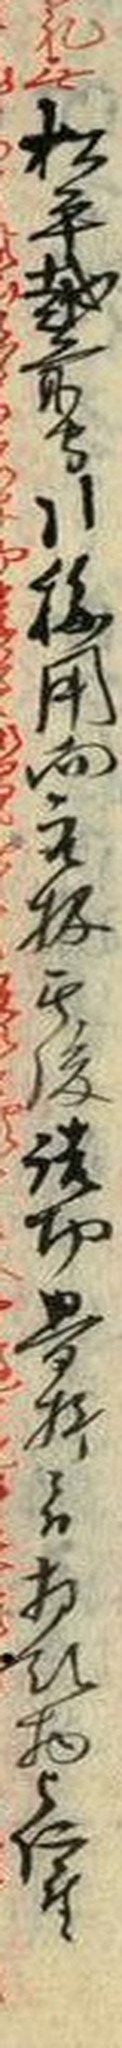松平越前守引移用向取扱其後詰切骨折ニ付拝領物被仰付候
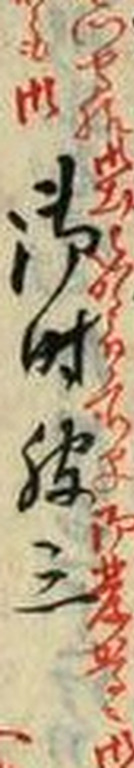御時服三

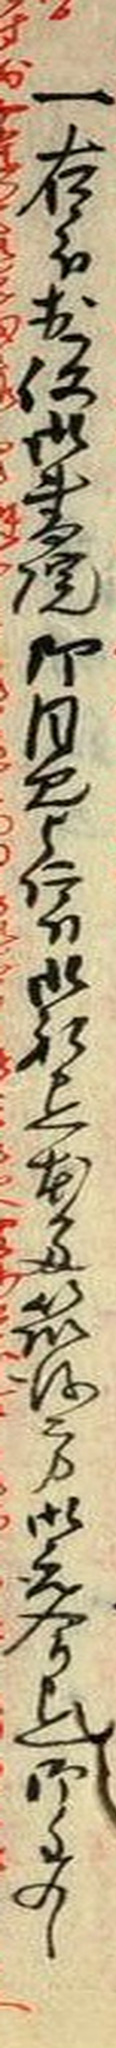一右ニ付於仮御書院御目見被仰付御礼申上本多筑後方御取合申上御手のし
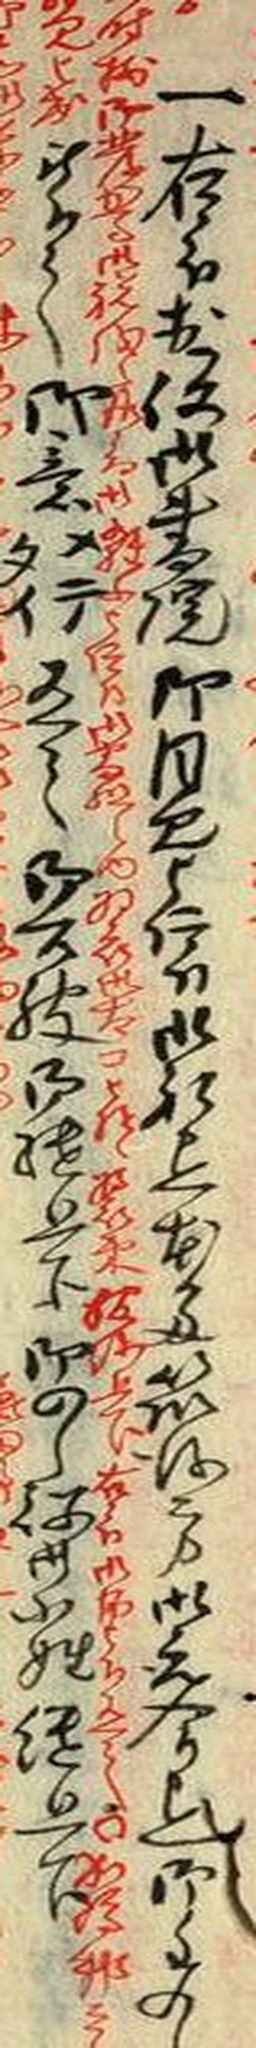被下之御意メテタイ有之御召服御継上下御のし役御小姓継上下
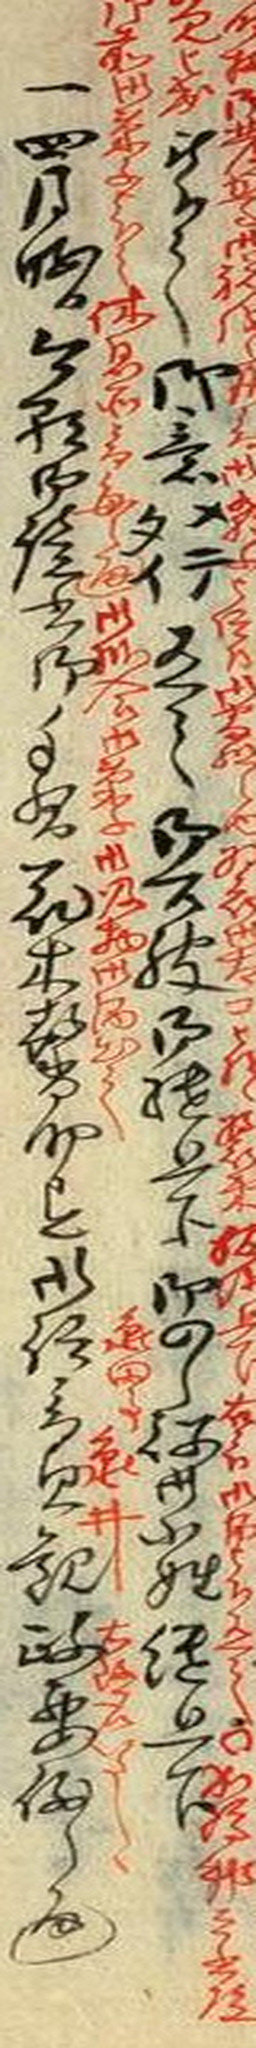一四月晦日今朝読書御手習花木馨助申上御仰ニ而貞観政要例之通
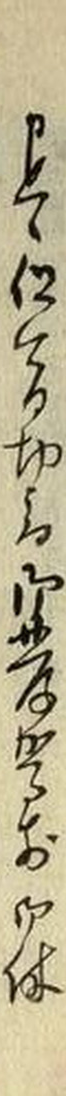申上候但今日切ニ而御発駕前御休
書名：少傅日録抄（斉善付側向頭取日記、江戸并道中、初入在国、逝去後…
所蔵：福井県文書館 Fukui Prefectural Archives
